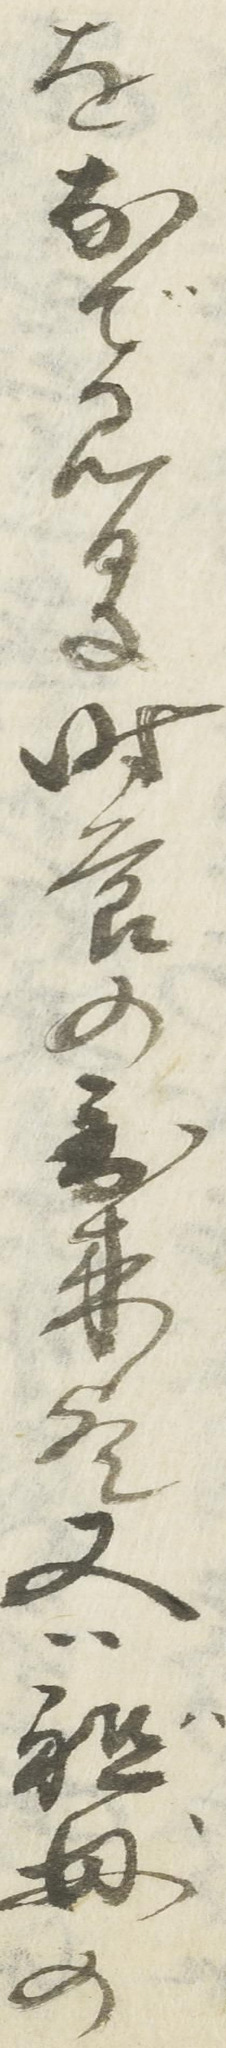をなで見る事時節の到来歟又は祖母の
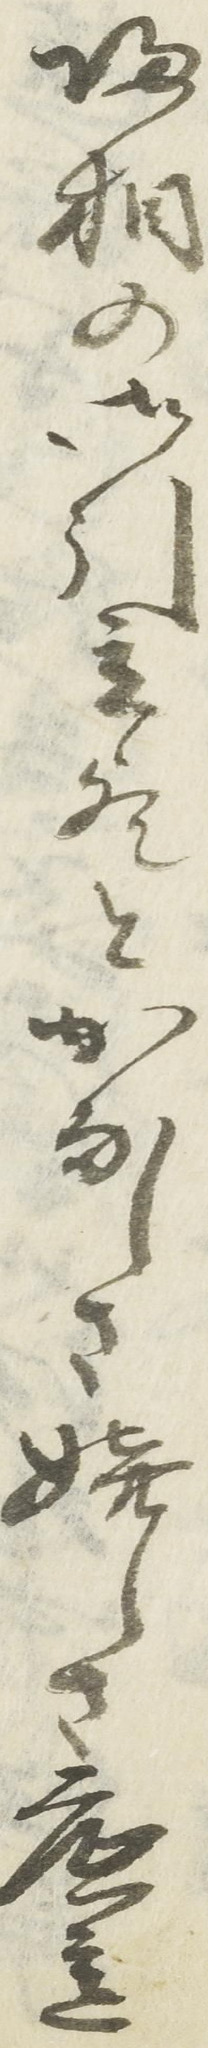帰相の御引立歟とかなしさ嬉しさ底意
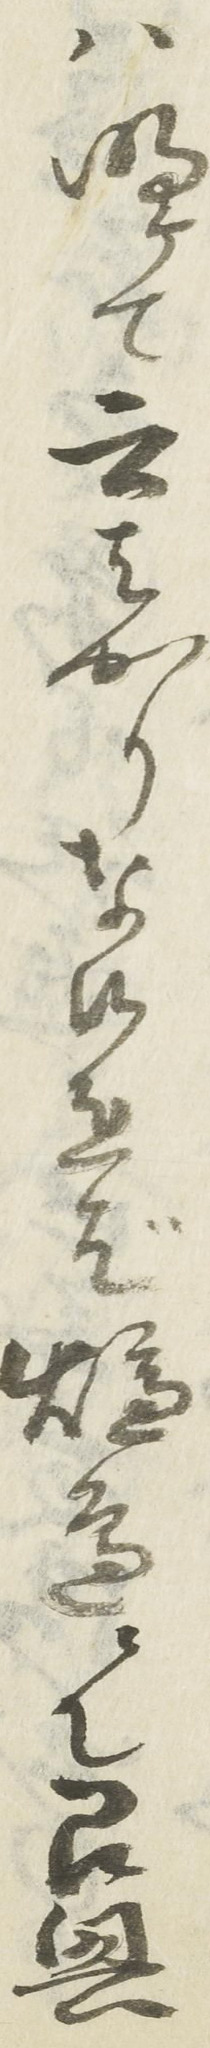は明ケて云はかりなければ燈辺ニて即興
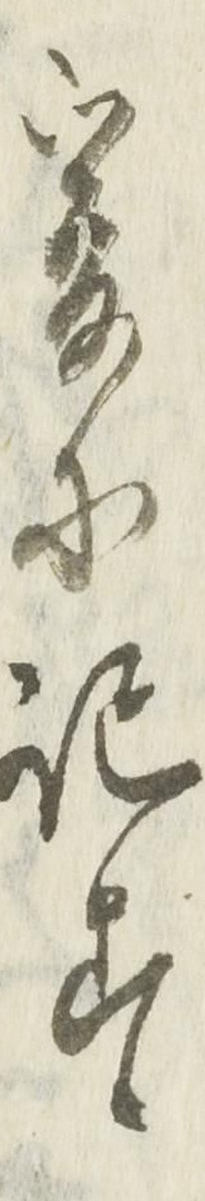爰に記す
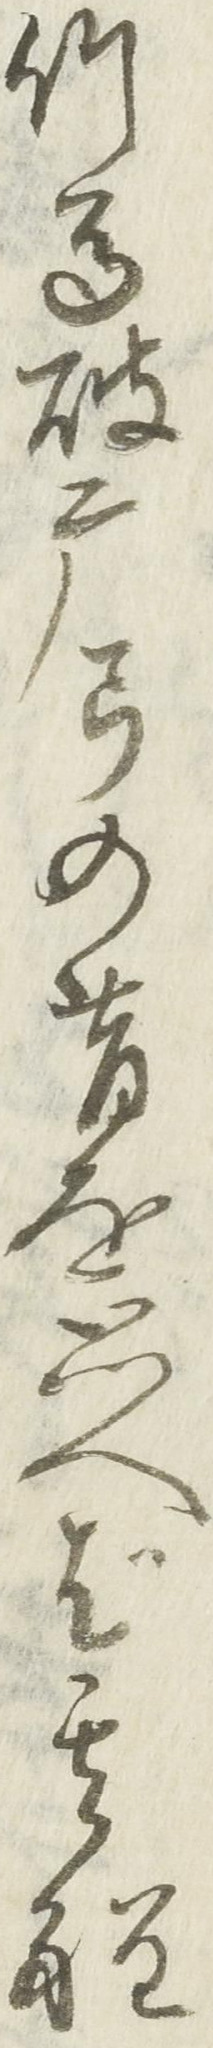竹馬破魔弓の昔を思へば其齢
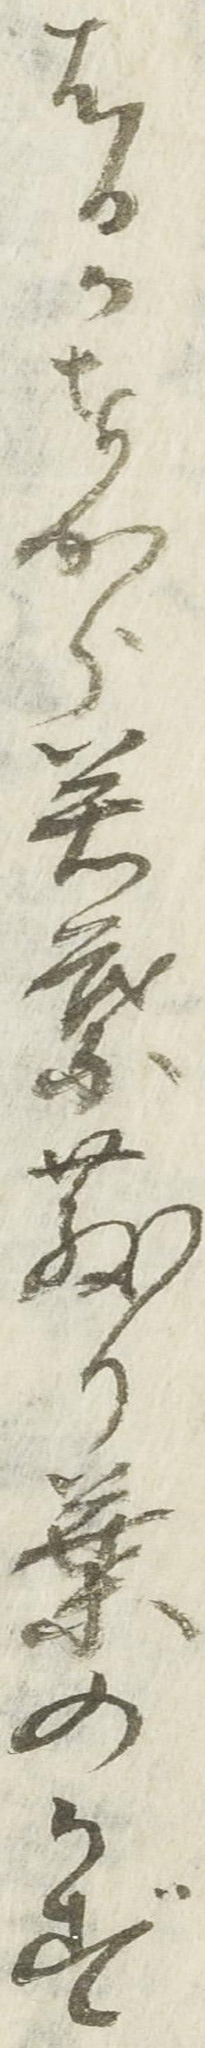はるかなから若葉散り葉のかず
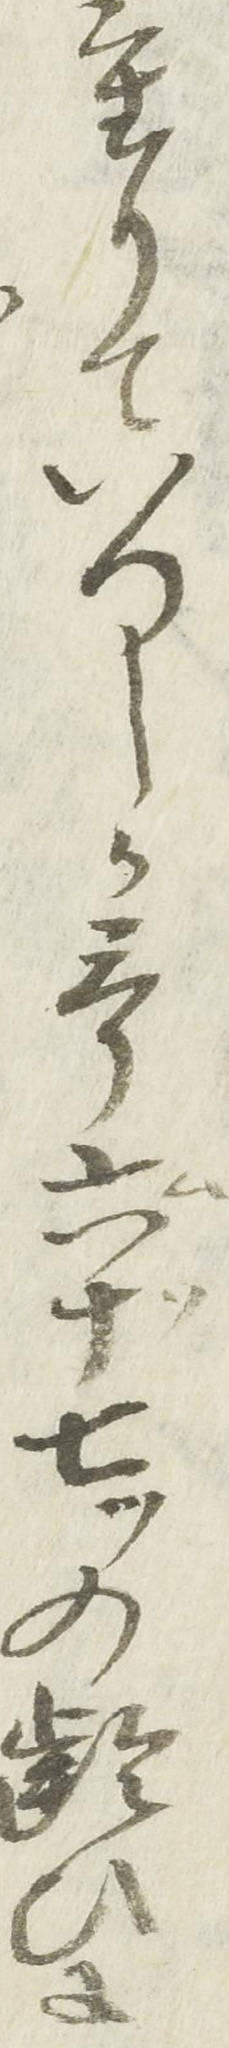重なりていろ〳〵か云う六十七ツの齢ひに
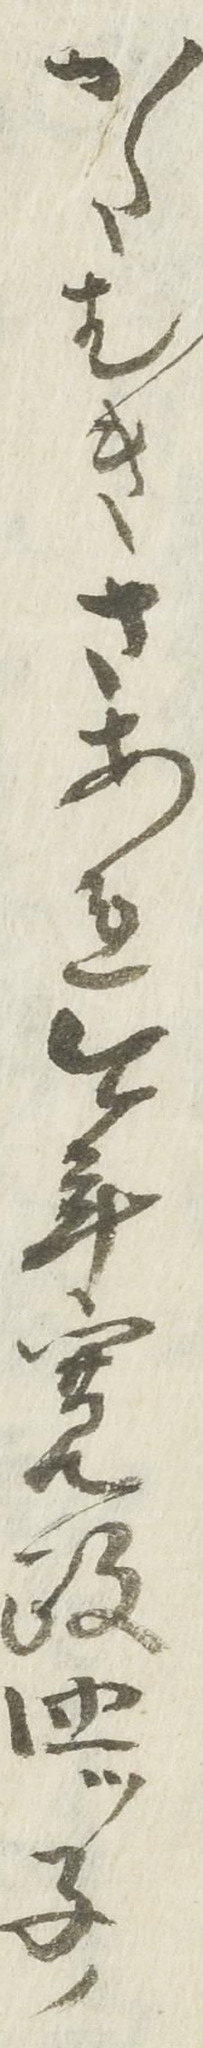かたむきさあれ今年寛政四ツ子ノ
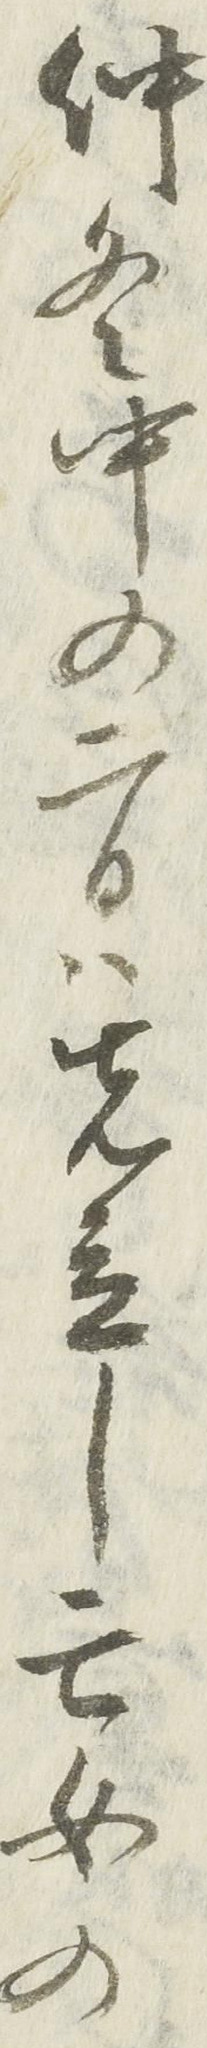仲冬中の二日は先立し亡女の
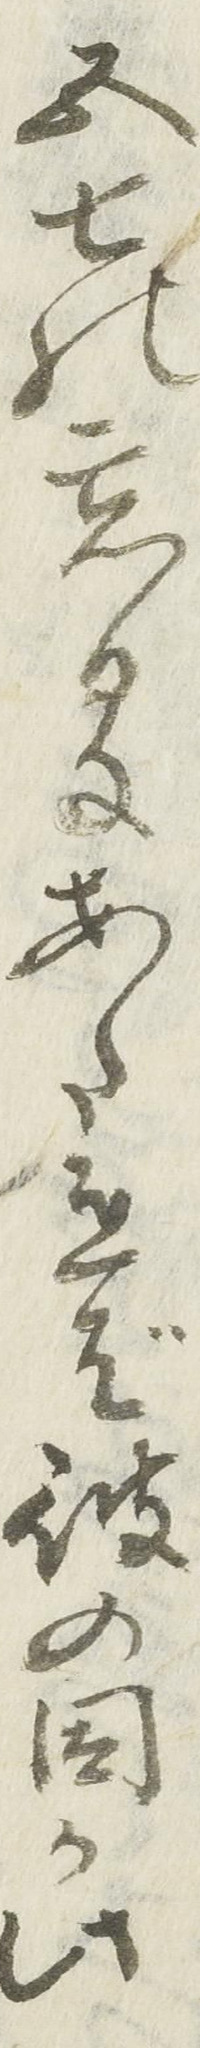五七の亡日にあたれぞ彼の国か此
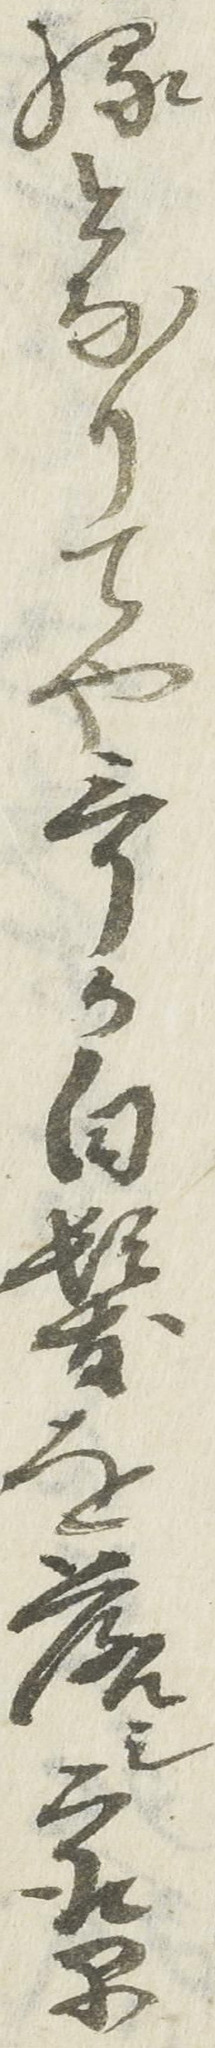縁となりてや気か白髪を落シ最早
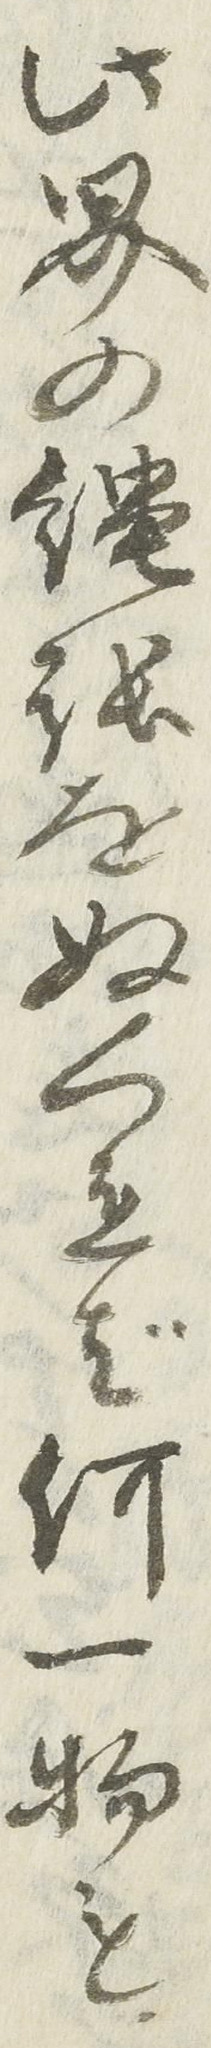此界の縄張をぬくれば何一物を
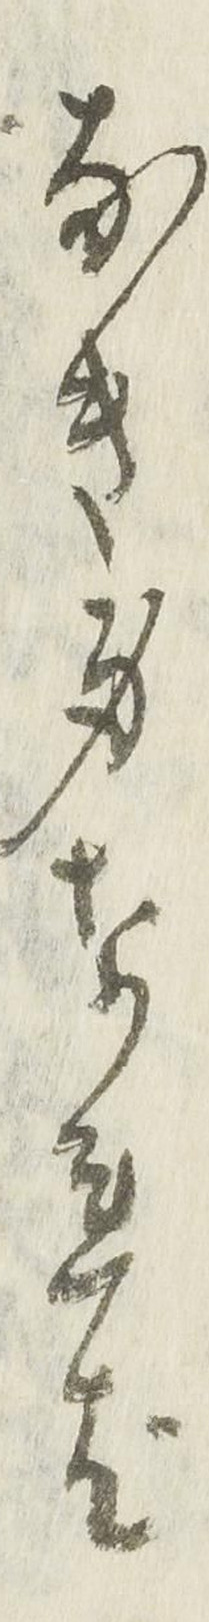なき身なれば
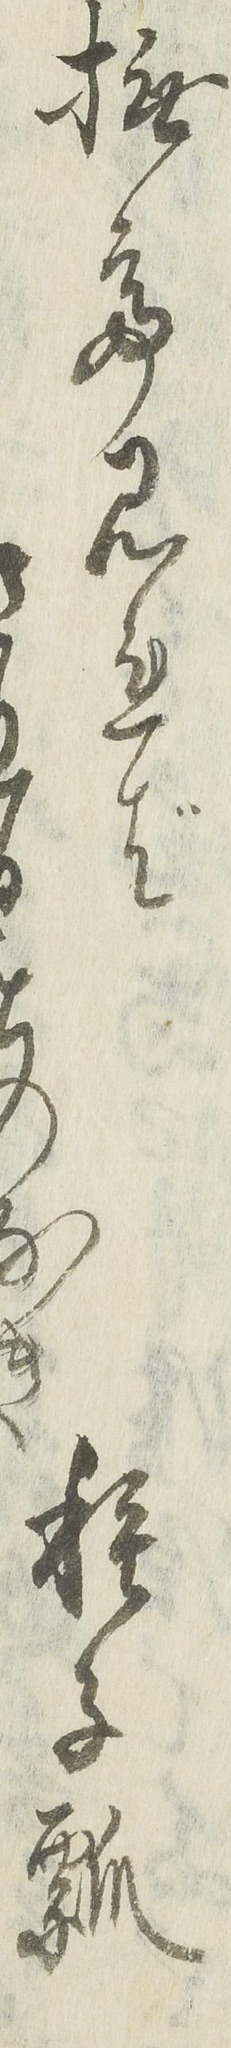梅鳥見れば種子瓢
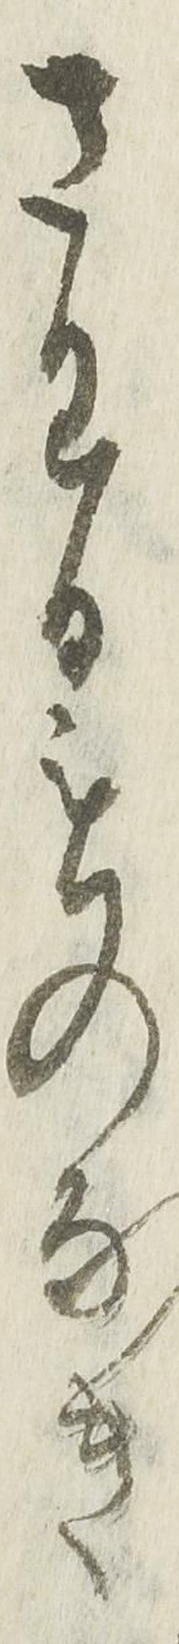さわるものなき
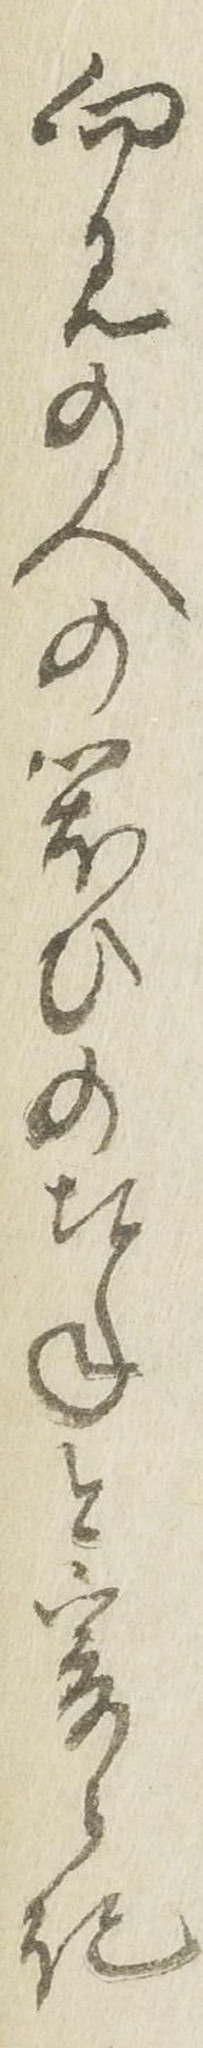向見の人の笑ひのたねと爰に記
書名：後見笑
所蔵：東京大学地震研究所図書室 Earthquake Research Institute Library, The University of Tokyo, JAPAN
